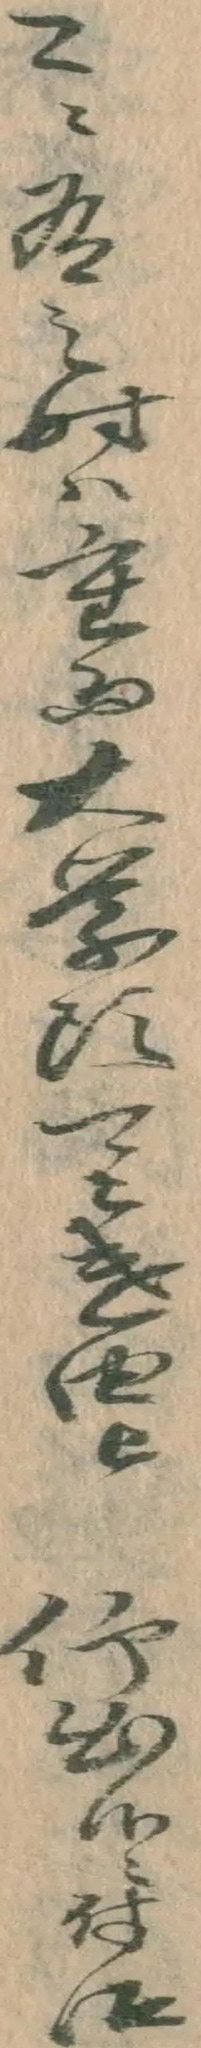々に有之時は重而大学頭可被遣由被仰出候に付御
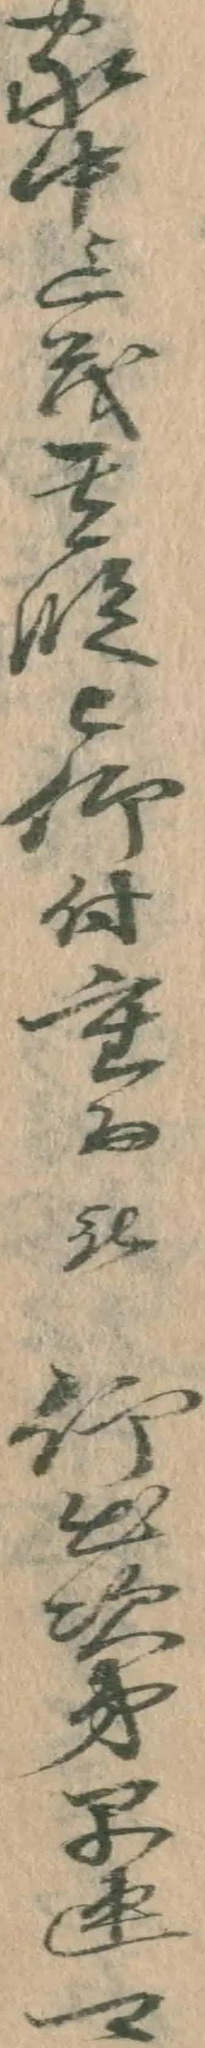家中迄も其段被仰付重而被仰出次第早速可
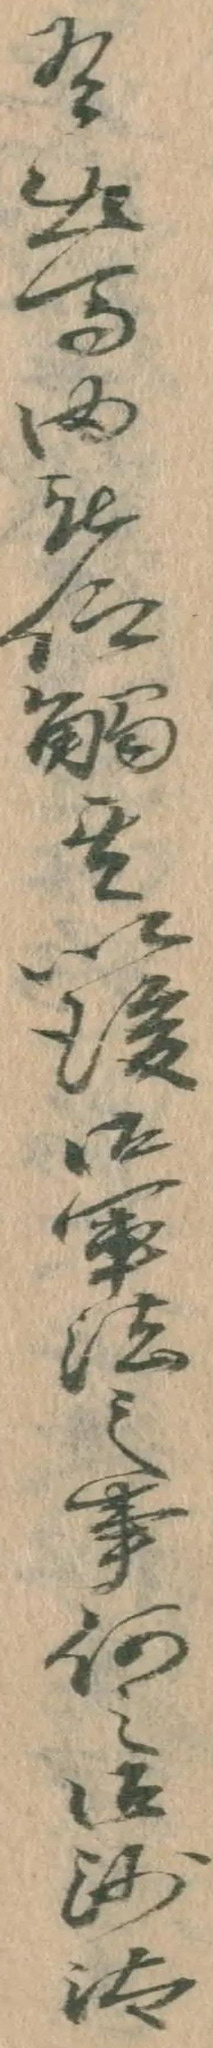有出馬由被仰触其以後御軍法之事何之御沙汰
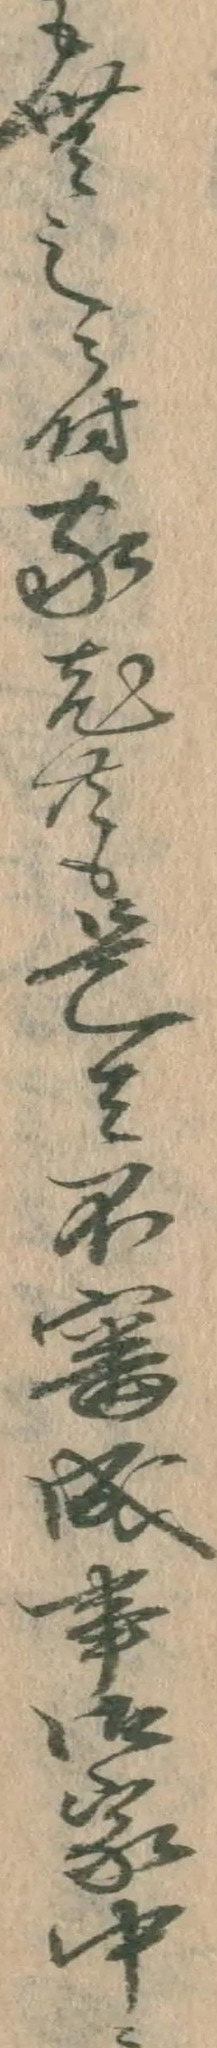も無之に付家老共も是は不審成事御家中に
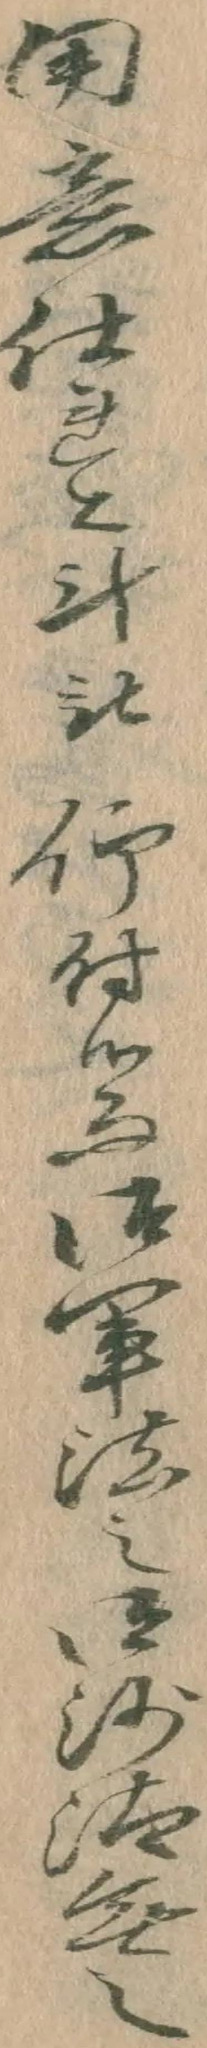用意仕れと計被仰付候而御軍法之御沙汰無之
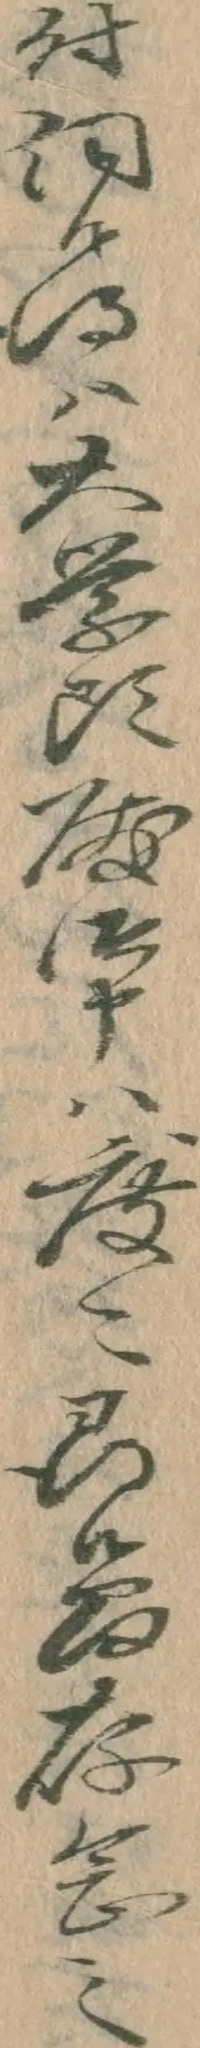付伺候得は大学頭殿御申は度々尋候間存念之
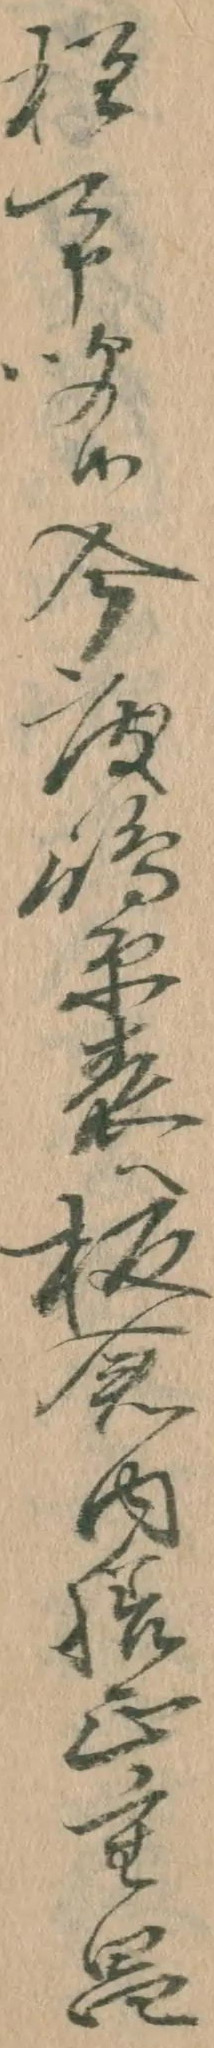程可申聞候今度島原表へ板倉内膳正重昌
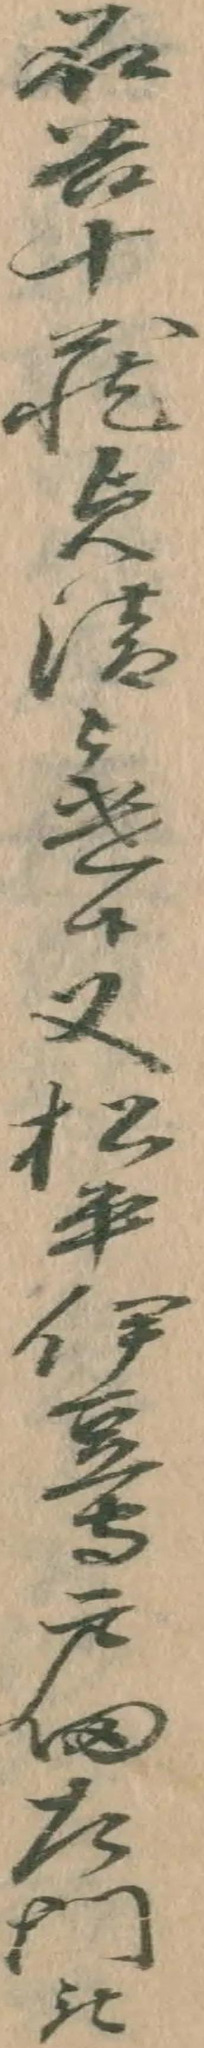石谷十蔵貞清被遣候又松平伊豆守戸田左門被
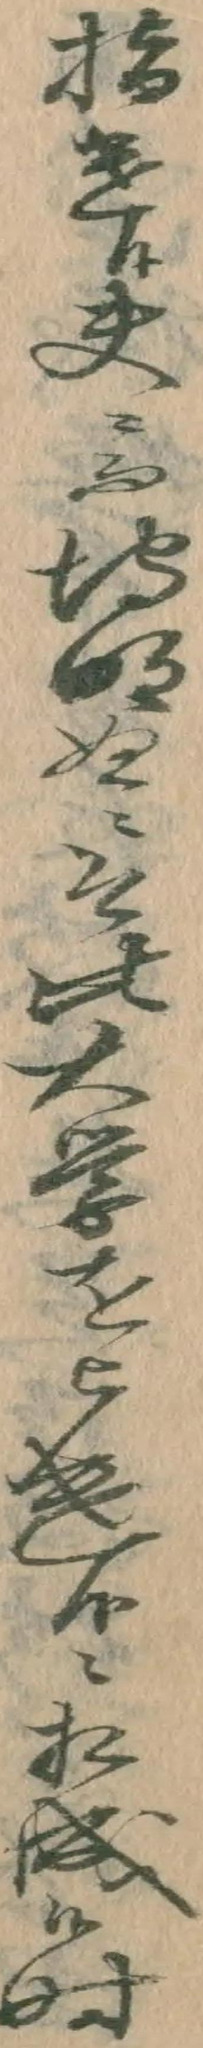指遣候夫に而埒明ぬにこそ此大学を被遣候に相成候時
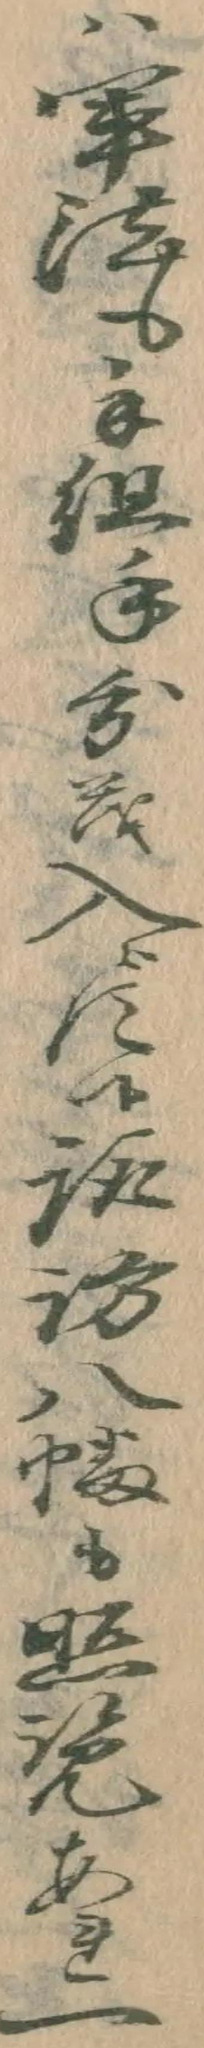は軍法も手組手分も入らす候諏訪八幡も照覧あれ一
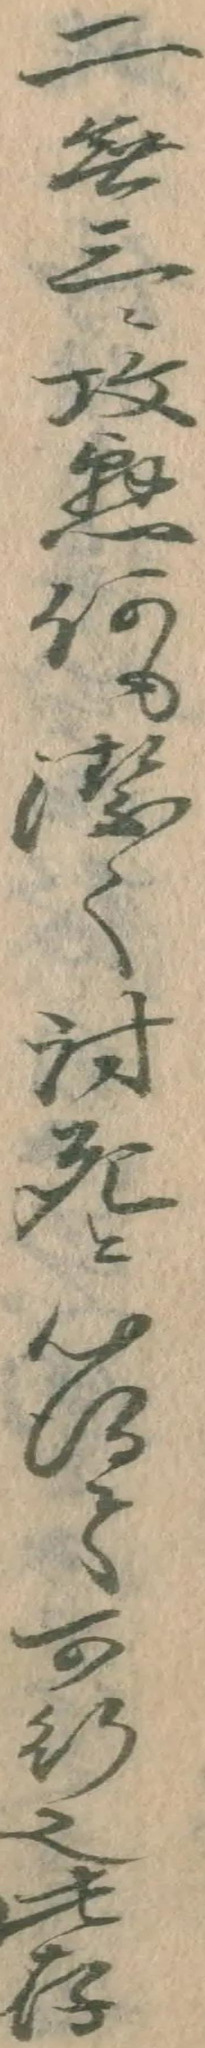二無三に攻懸何も潔く討死と心得て可行也此存
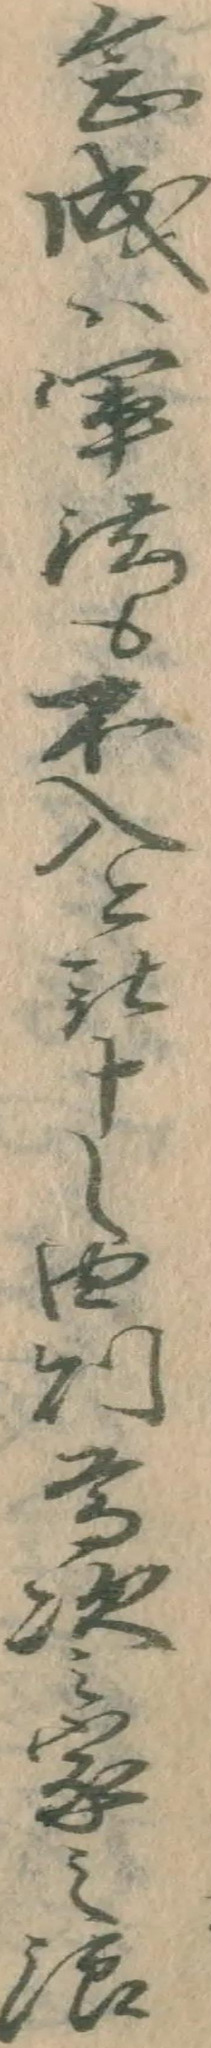念成は軍法も不入と被申し由則高次之家之浪
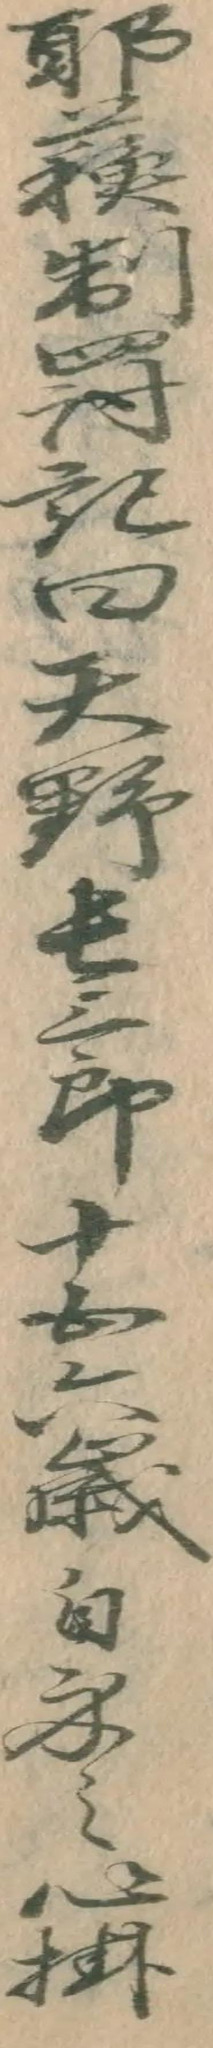耶蘇制罰記曰天野長三郎十五六歳自身之心掛
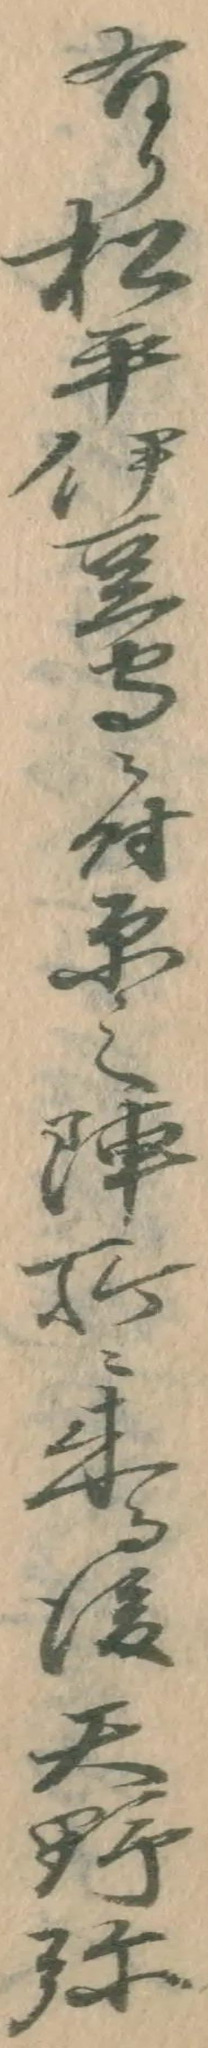有り松平伊豆守に付原之陣所に来る後天野弥

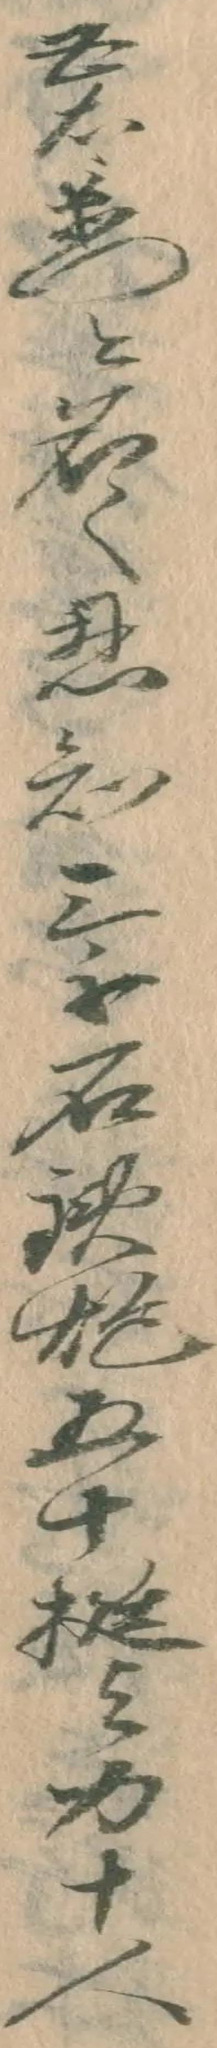五右衛門と名く恩知三千石鉄炮五十挺と力十人
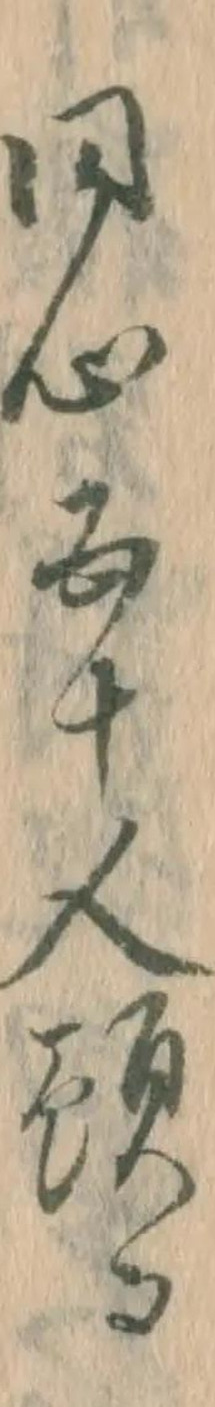同心五十人預る
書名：切支丹御退治記 49巻. [3]
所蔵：国立国会図書館 National Diet Library, JAPAN
